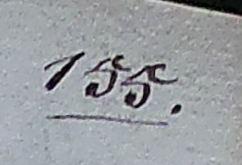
155.
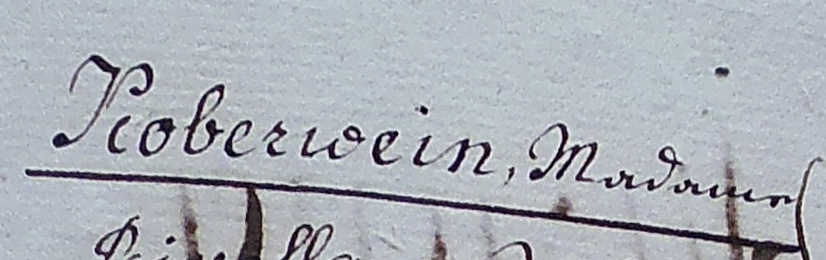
Koberwein, Madame
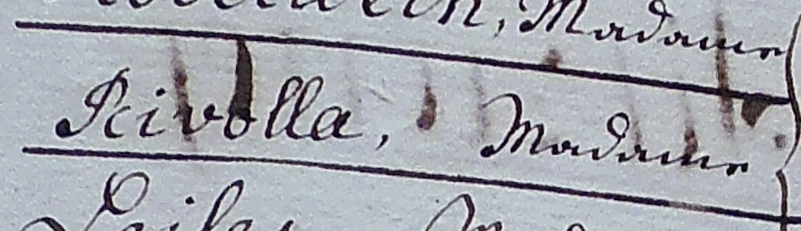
Rivolla, Madame
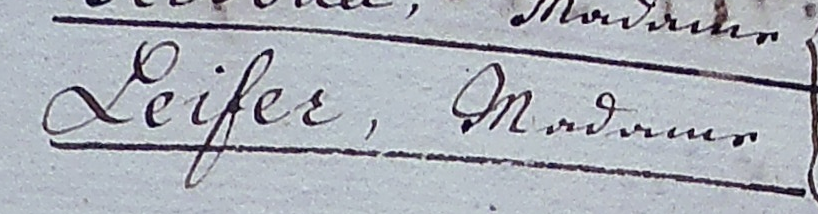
Leifer, Madame
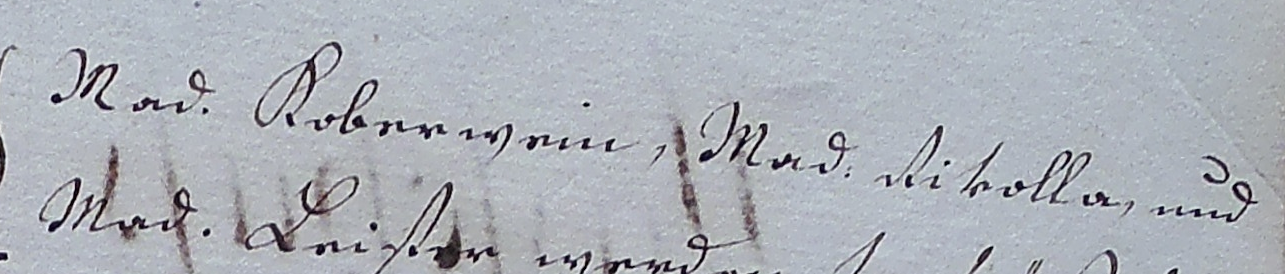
Mad. Koberwein, Mad. Rivolla, und
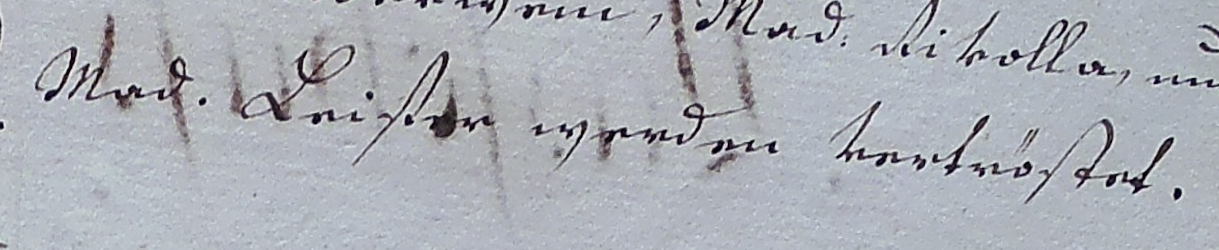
Mad. Leifer werden vertröstet.
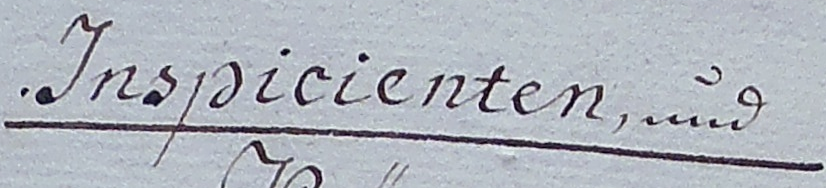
Inspicienten, und
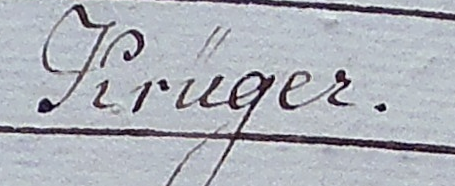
Krüger.
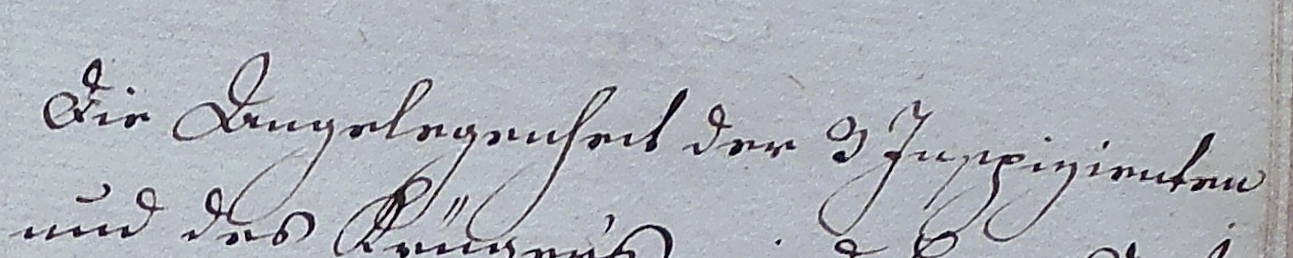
Die Angelegenheit der 3 Inspizienten
